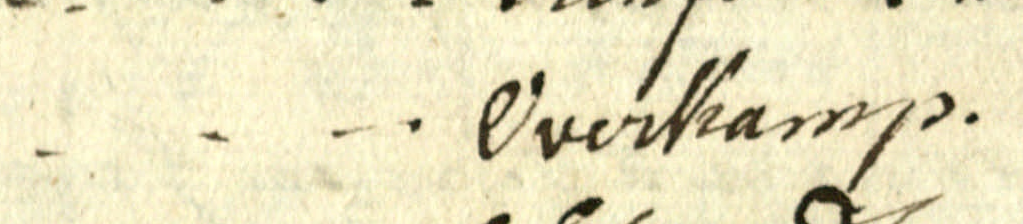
Overkamp.
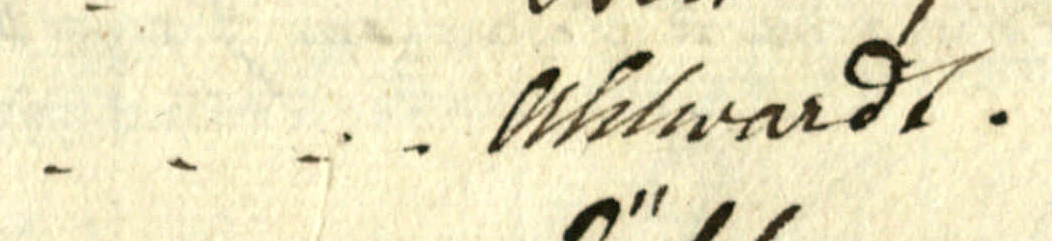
Ahlwardt.
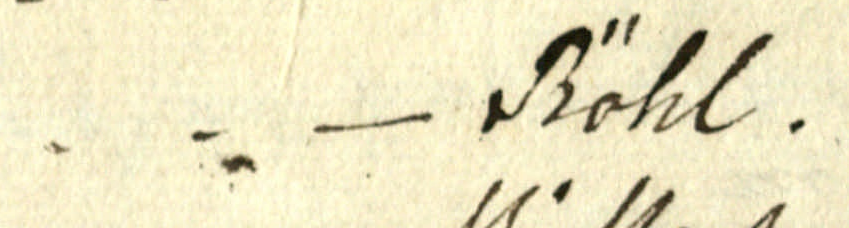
Röhl.
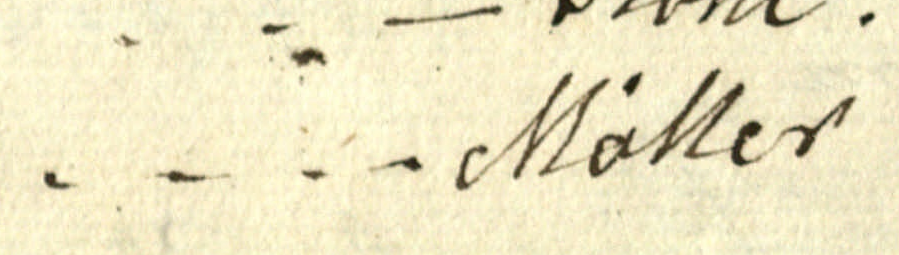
Möller
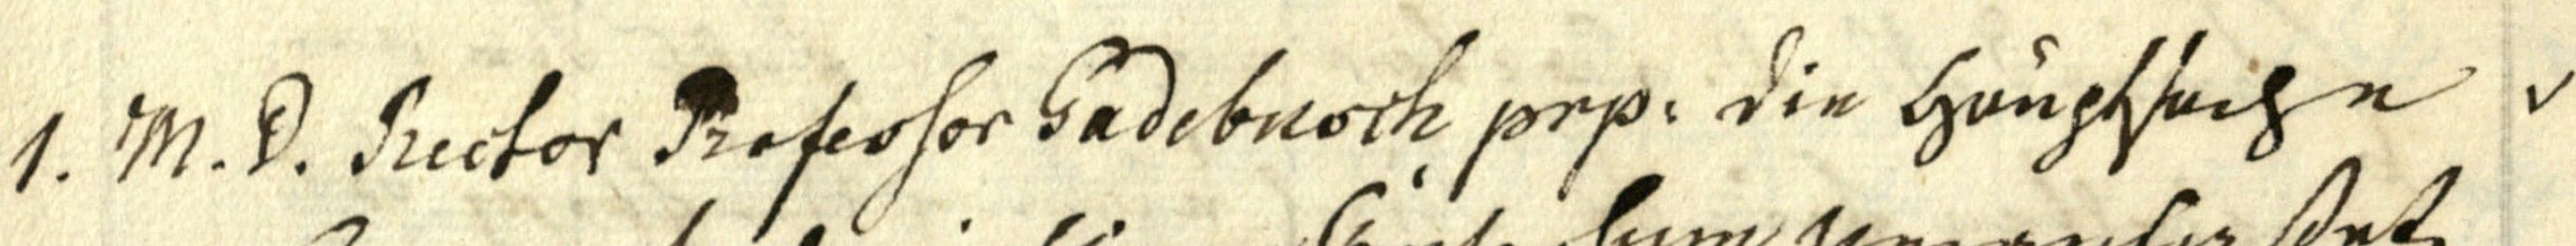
1. M. D. Rector Professor Gadebusch prp. die Hauptsache
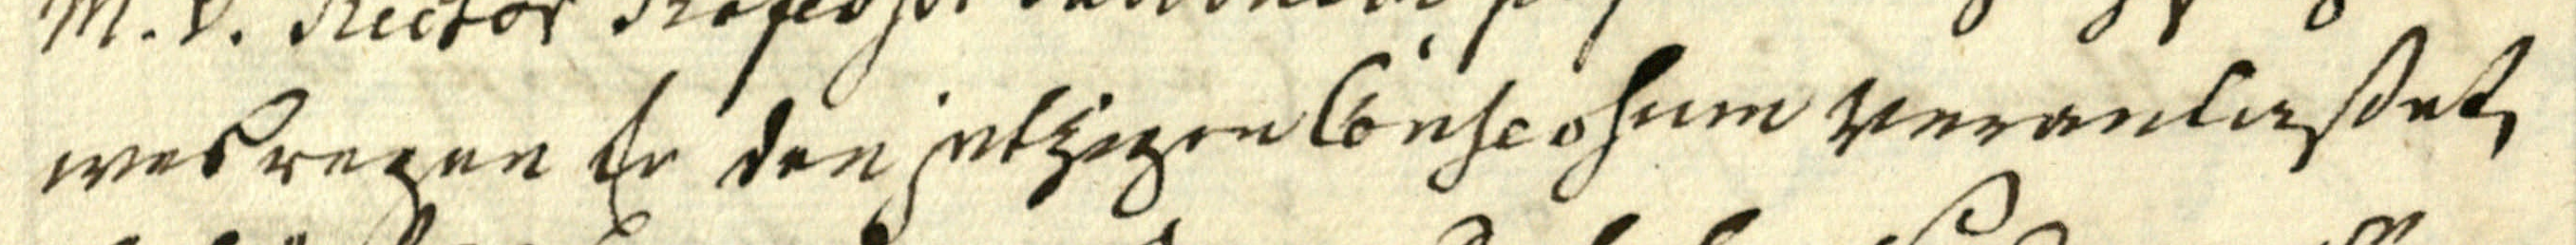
weswegen Er den jetzigen Consessum veranlaßet,
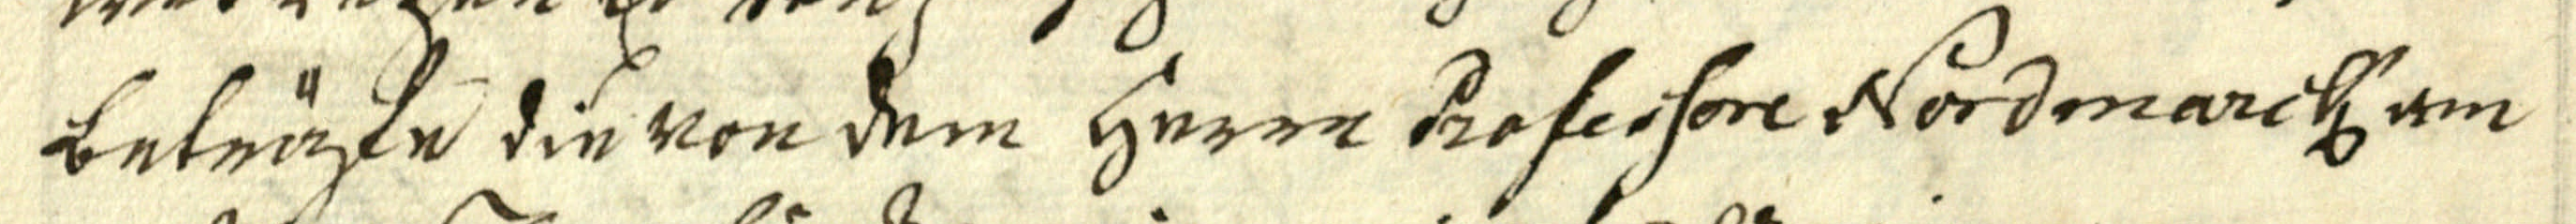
beträfe die von dem Herrn Professore Nordmarck am
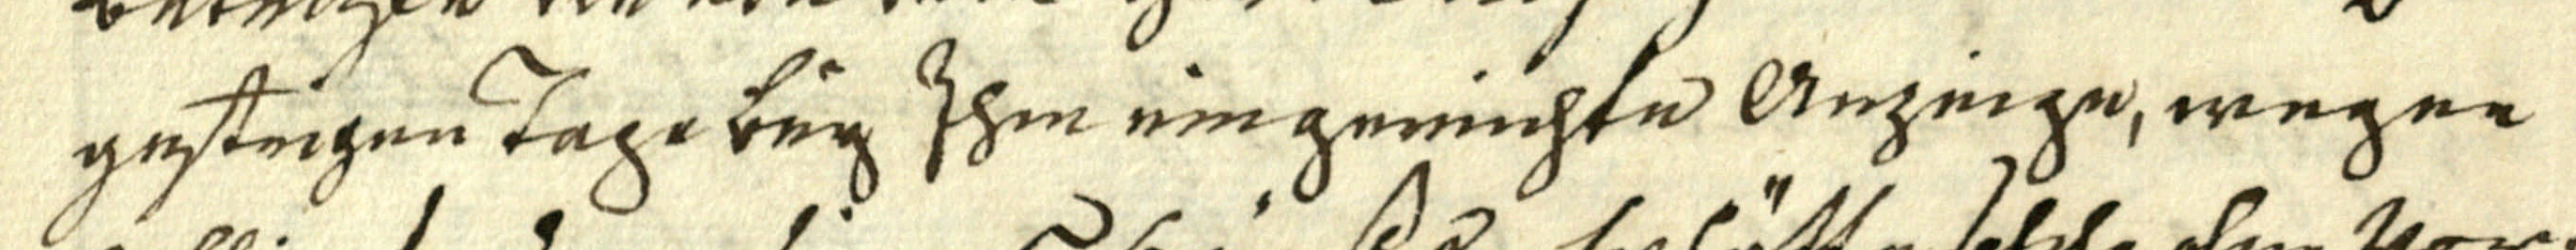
gestrigen Tage beÿ Ihm eingereichte Anzeige, wegen
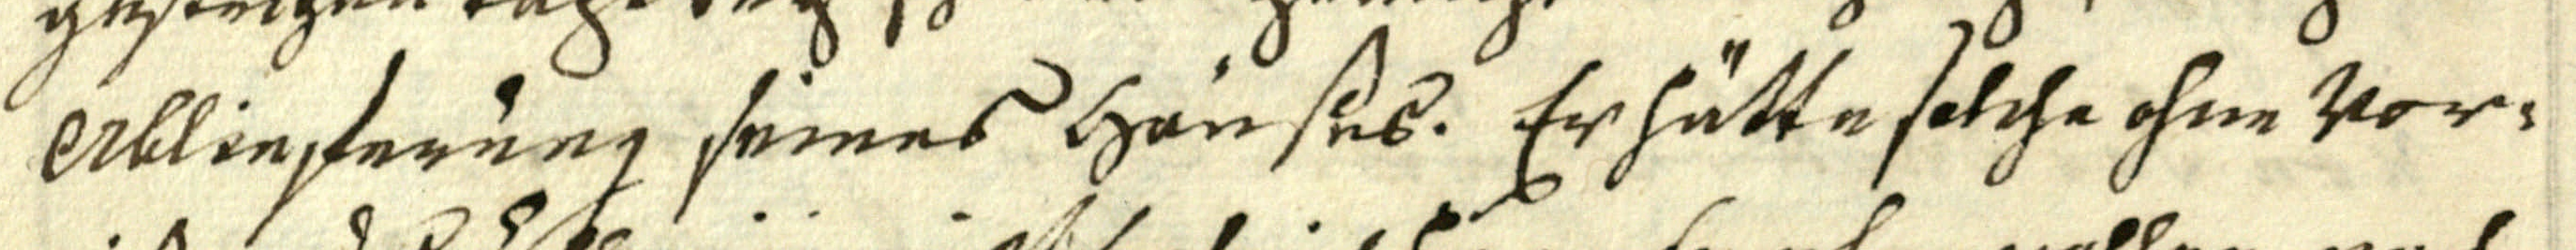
Ablieferung seines Haußes. Er hätte solche ohne Vor¬
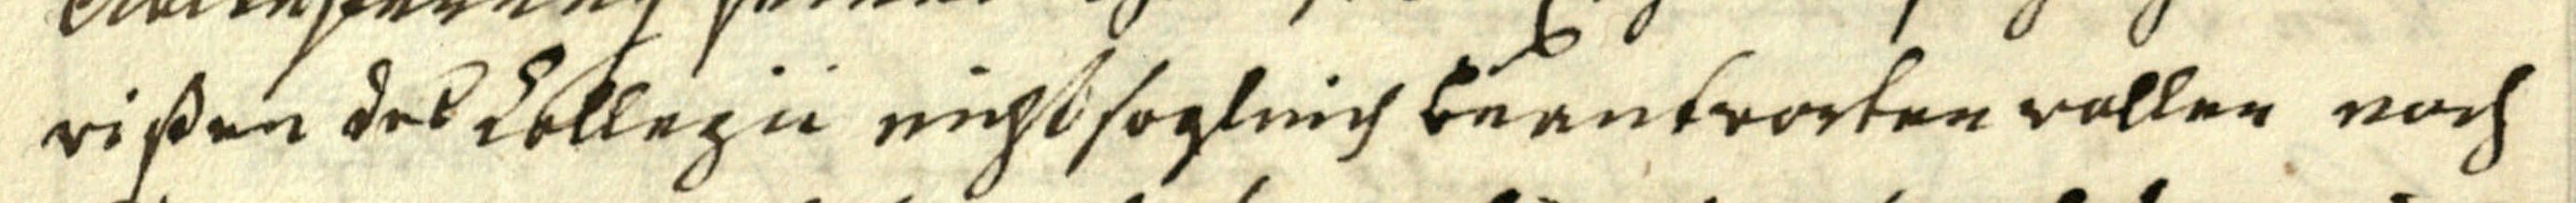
wißen des Collegii nicht sogleich beantworten wollen, noch
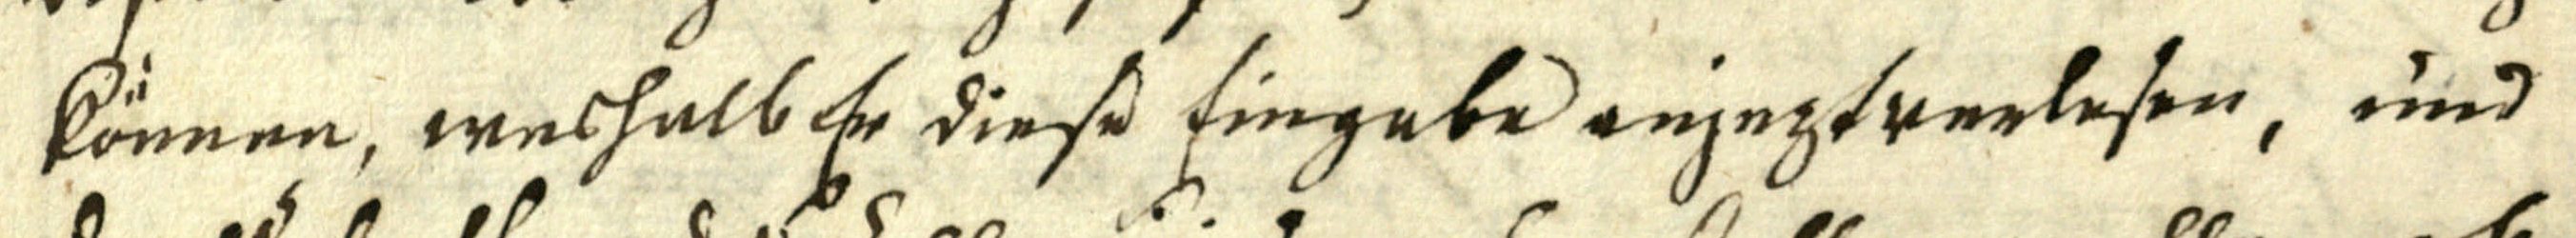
können, weshalb Er diese Eingabe anjezt verlesen, und
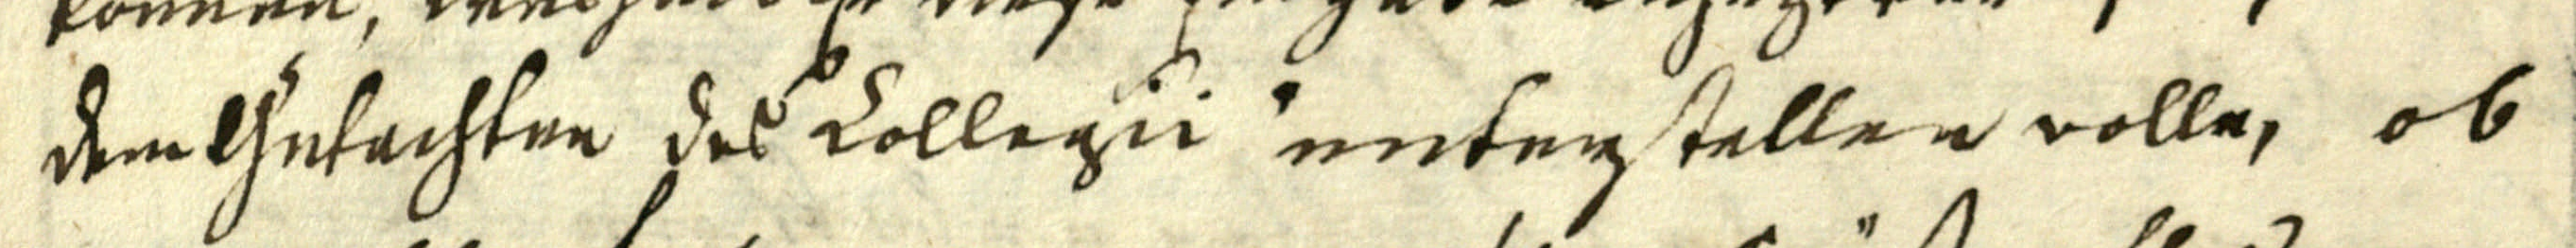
dem Gutachten des Collegii unterstellen wolle, ob
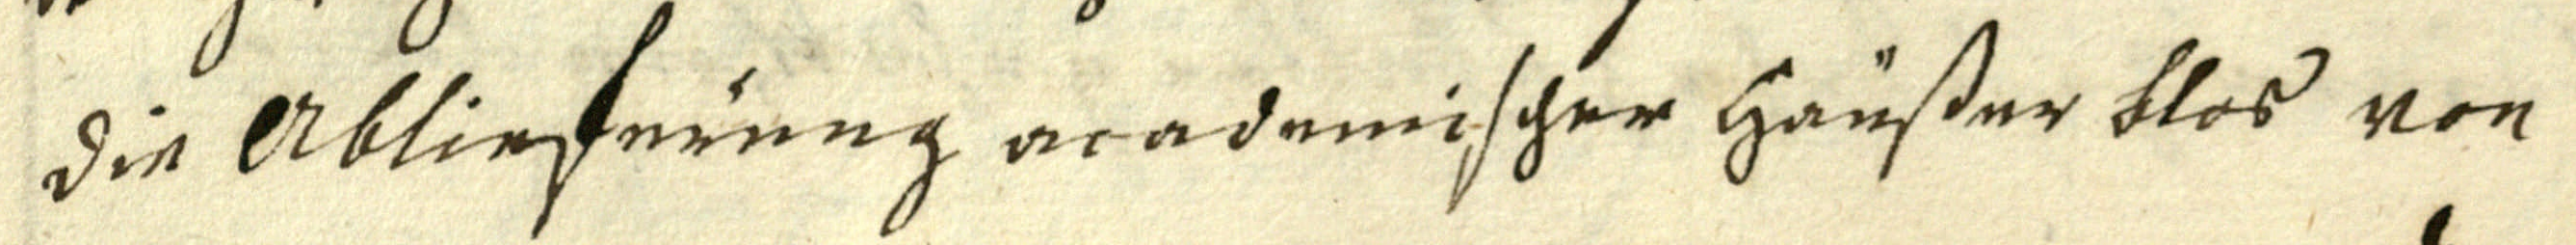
die Ablieferung academischer Häußer blos von
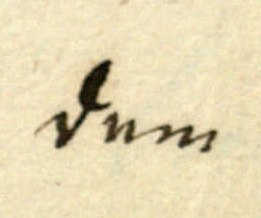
dem
